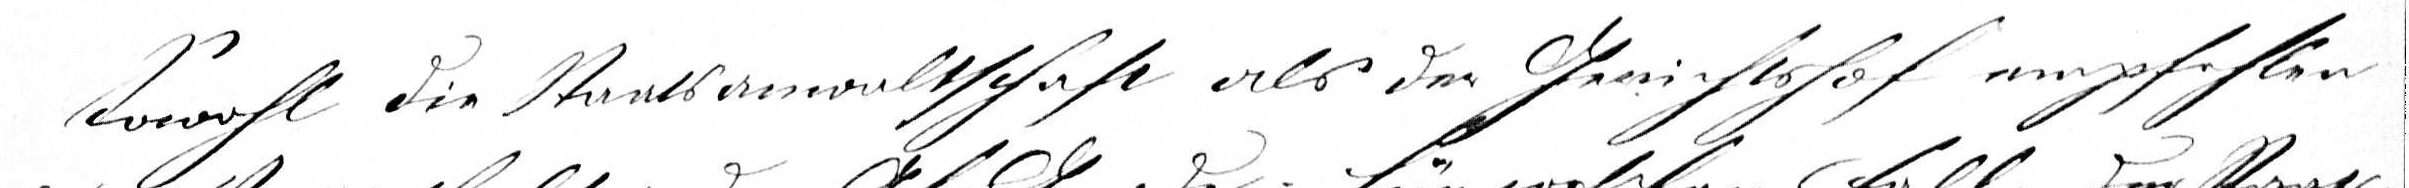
Sowohl die Staatsanwaltschaft als der Gerichtshof empfehlen
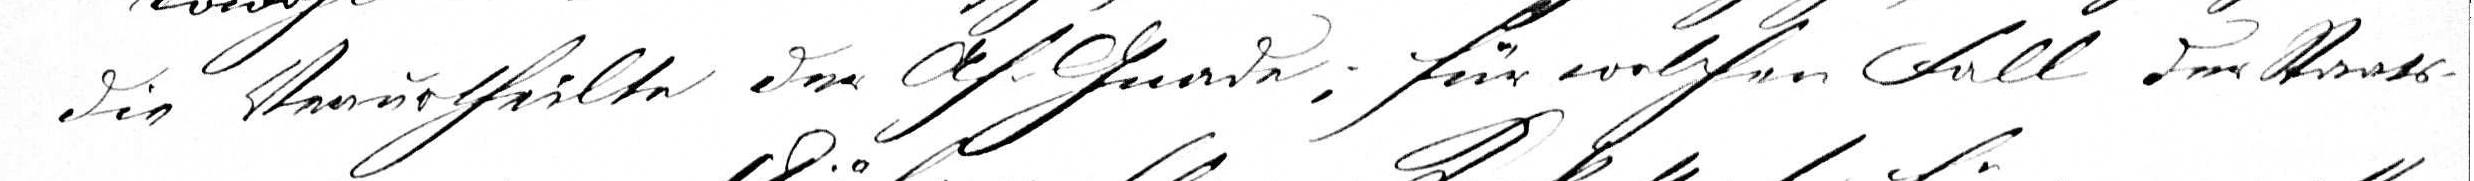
die Verurtheilte der Ah. Gnade; für welchen Fall der Staats¬
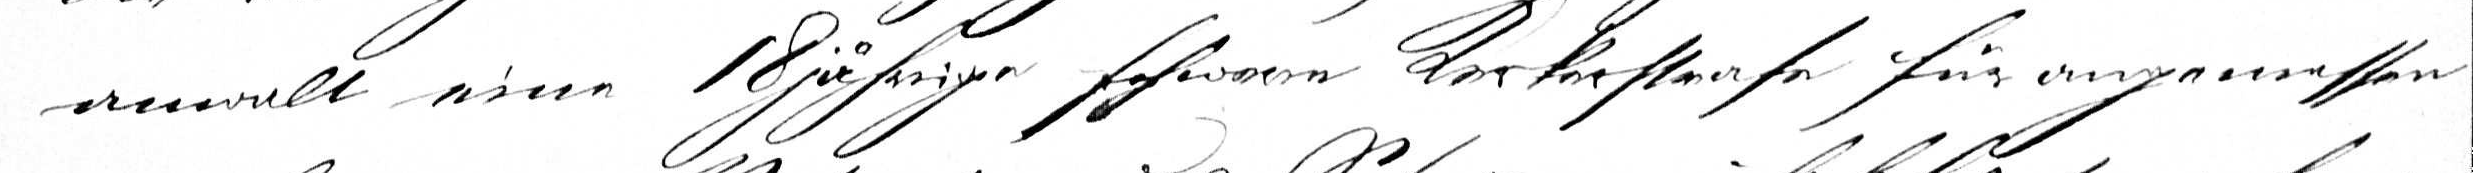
anwalt eine 18jährige, schwere Kerterstrafe sie angemessen
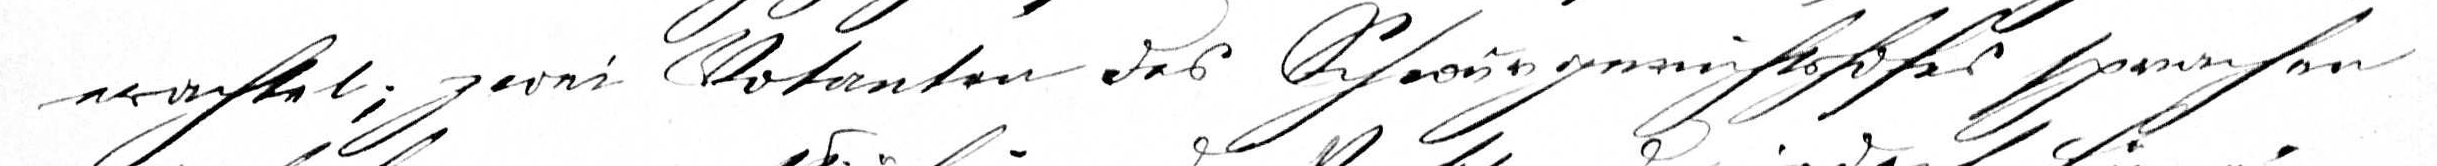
erachttet; zwei Votanten des Schröngereichtsxxxses sperachen
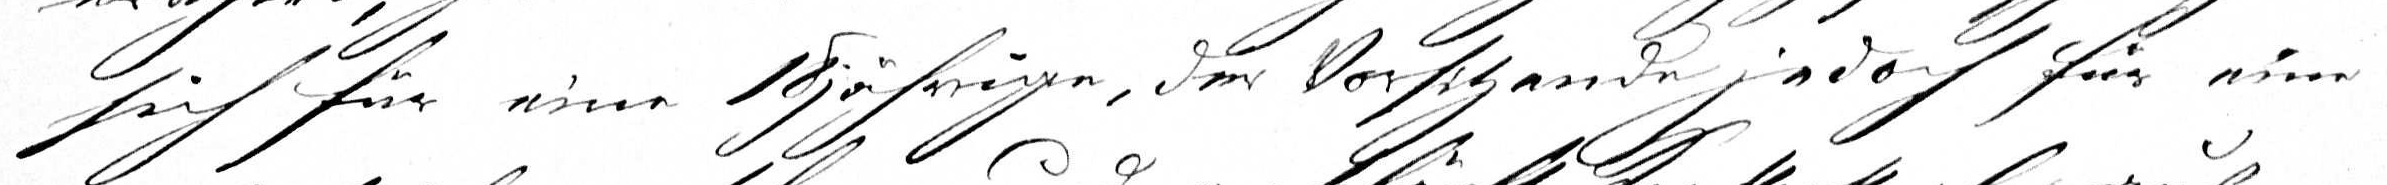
sich für eine 18 jährige, der Vorsitzende jedoch für eine
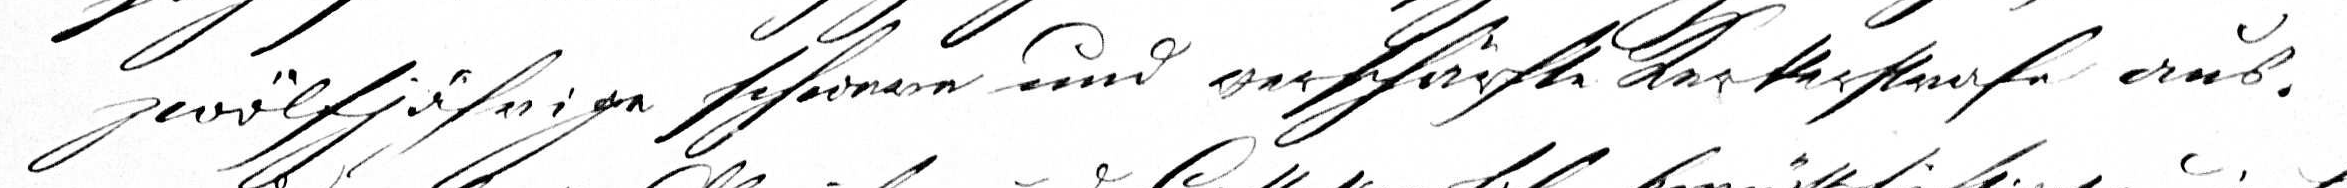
zwölfjährige schwere und verschärfte Kerkerstrafe aus.
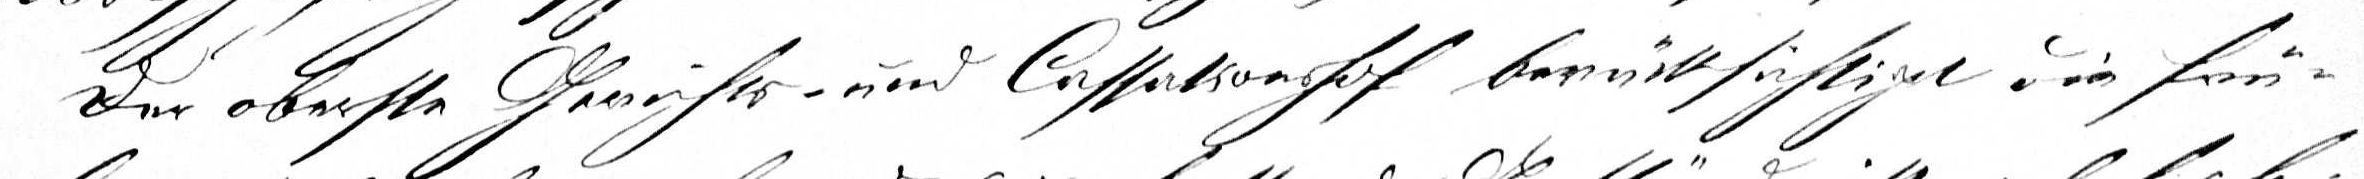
Der oberste Gerichts- und Cassationshof berücksichtigt die frü¬
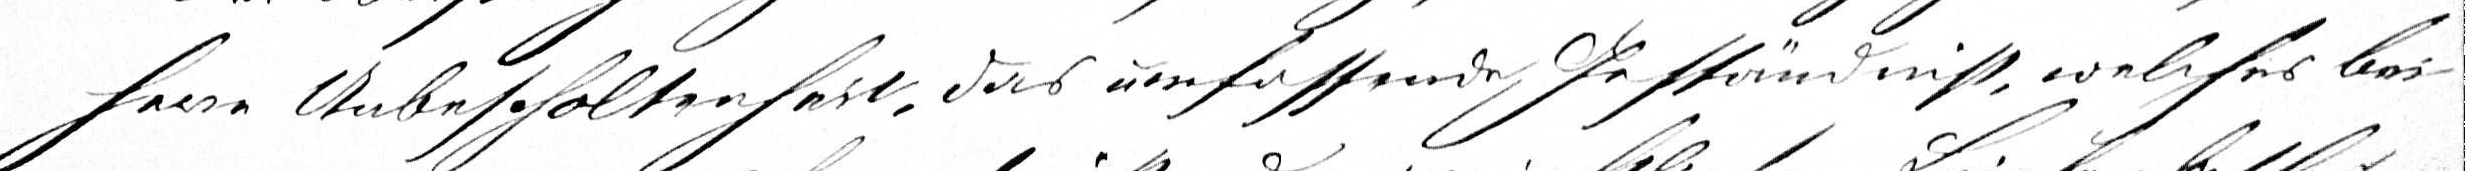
here Unbescholtenheit, das umfassende Geständniß, welches bei¬
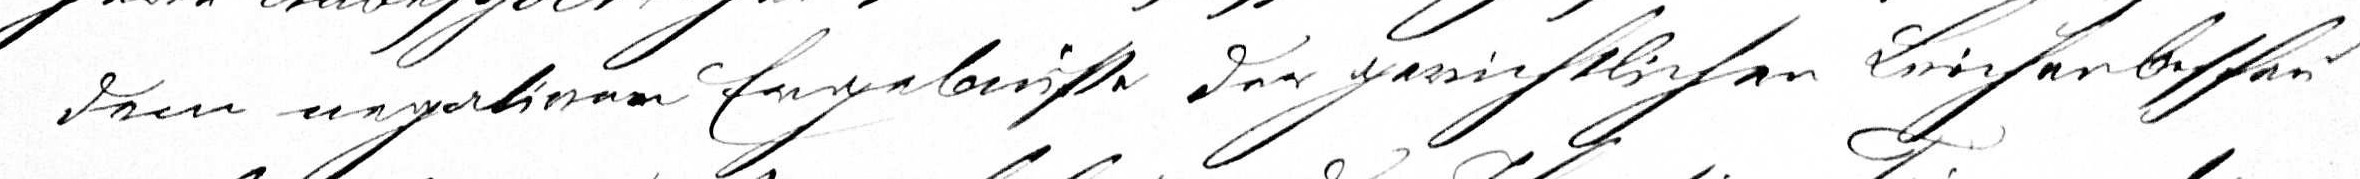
dem negativen Ergebniße der gerichtlichen Leichen xx
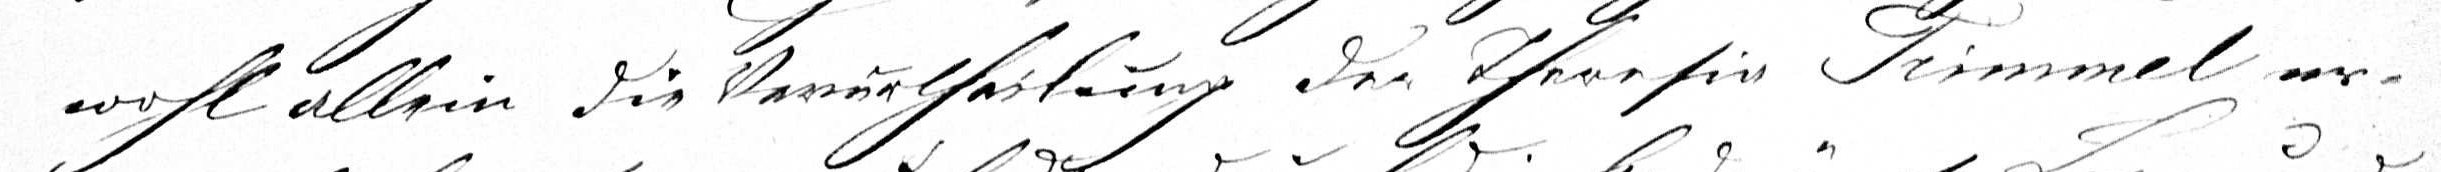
wohl allein die Verurtheilung der Theresia Trimmel er¬
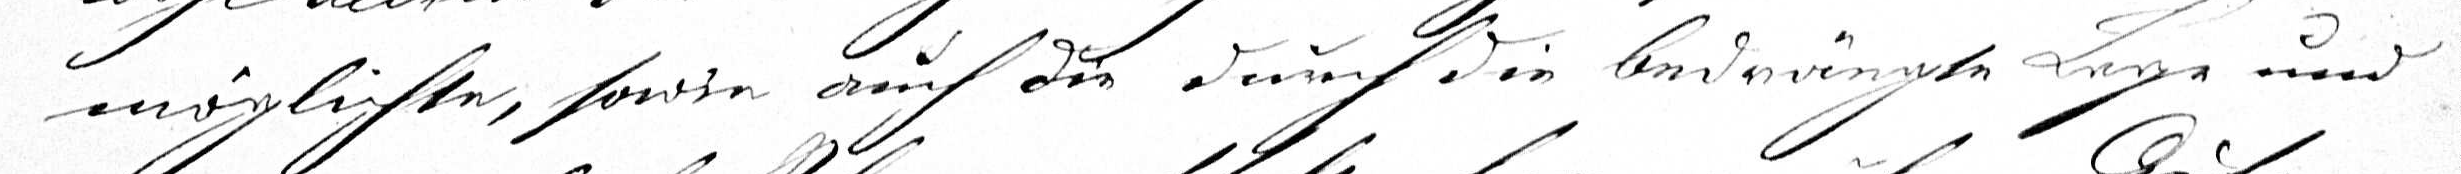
möglichte, sowie auch die durch die bedrängte Lage und
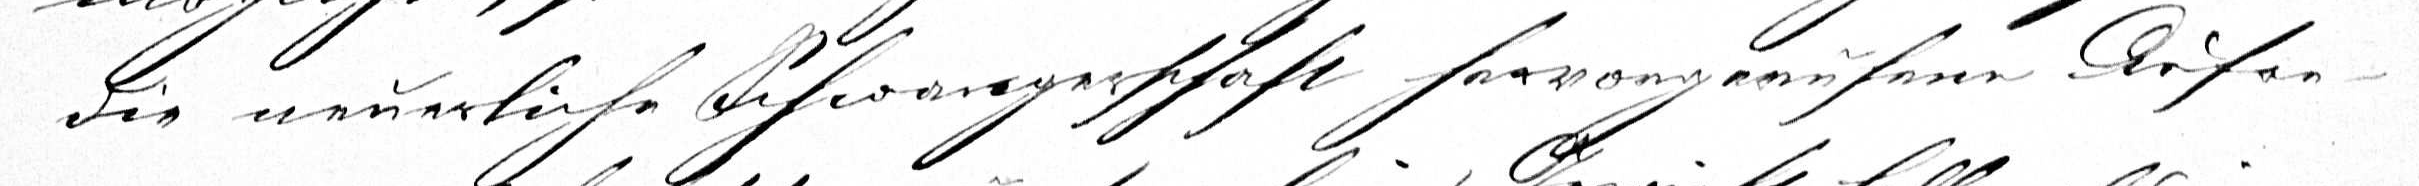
die neuerliche Schwangerschaft hervorgerufene Aufre¬
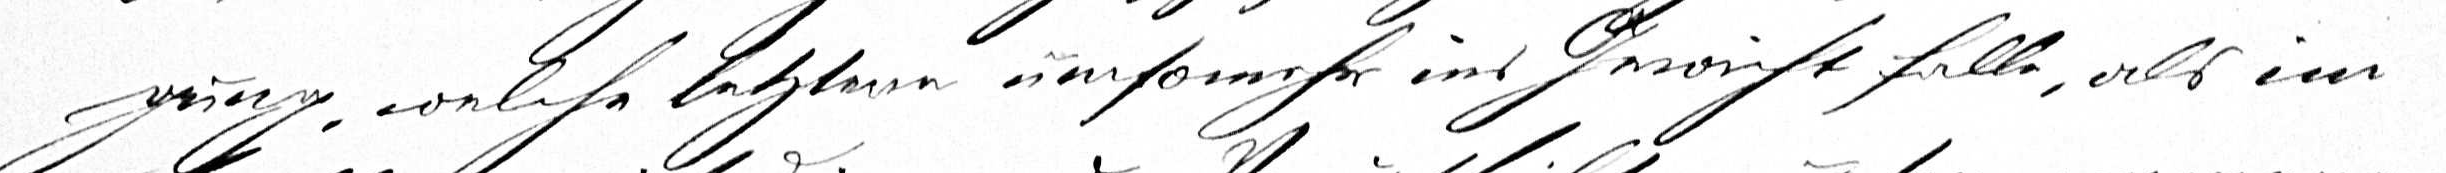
gung, welche letztere umsomehr ins Gewicht falle, als im
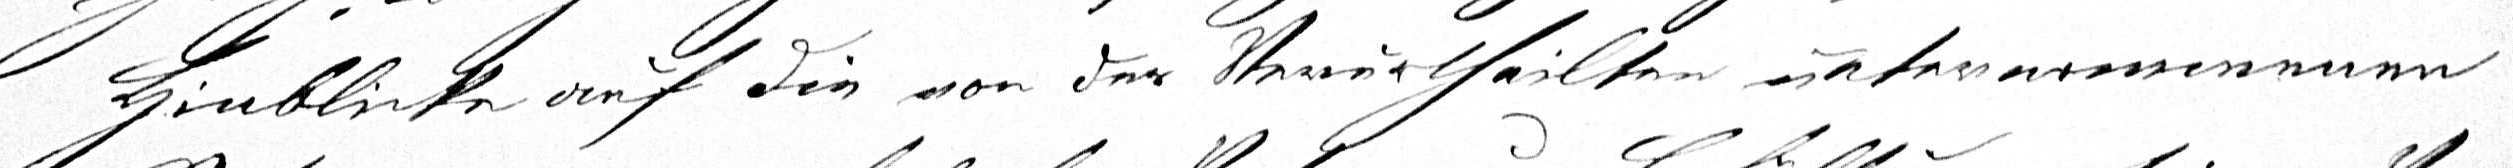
Hinblicke auf die von der Verurtheilten unternommenen
